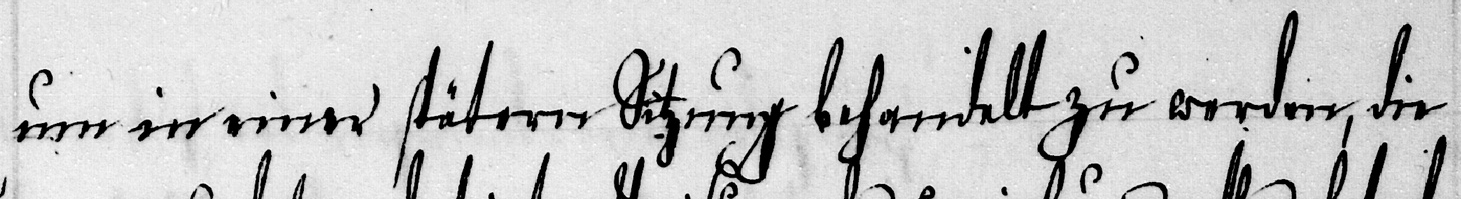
um in einer spätern Sitzung behandelt zu werden, die
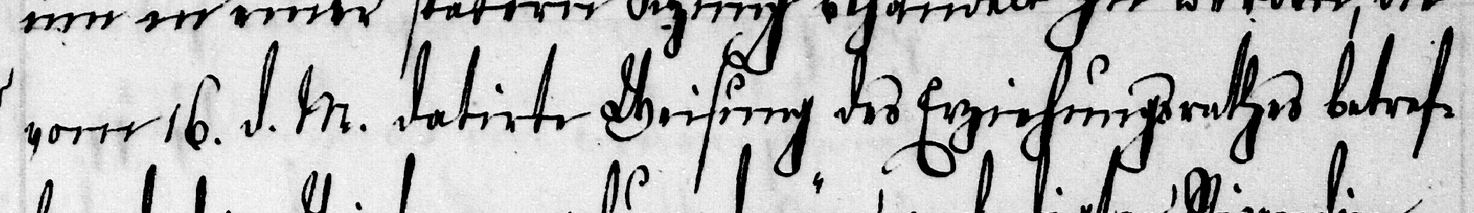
vom 16. d. M. datirte Weisung des Erziehungsrathes betref¬
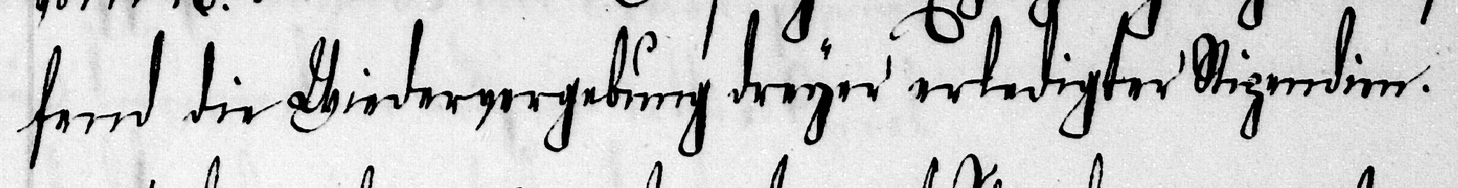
fend die Wiedervergebung dreyer erledigter Stipendien.
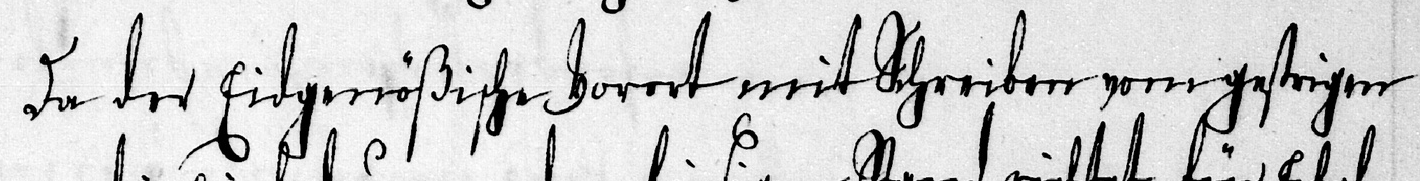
Da der Eidgenößische Vorort mit Schreiben vom gestrigen
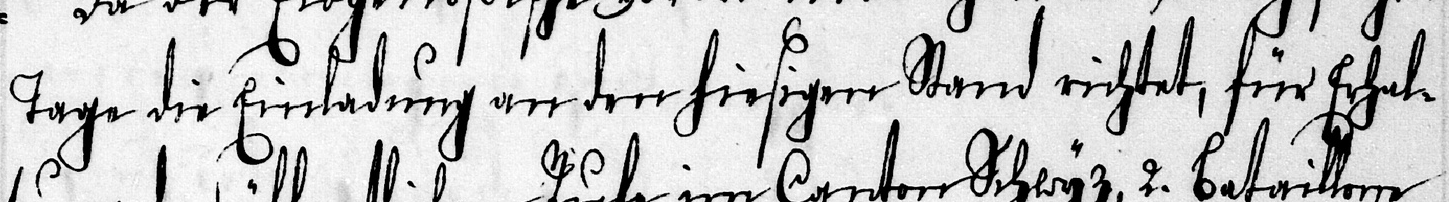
Tage die Einladung an den hiesigen Stand richtet, für Erhalt¬
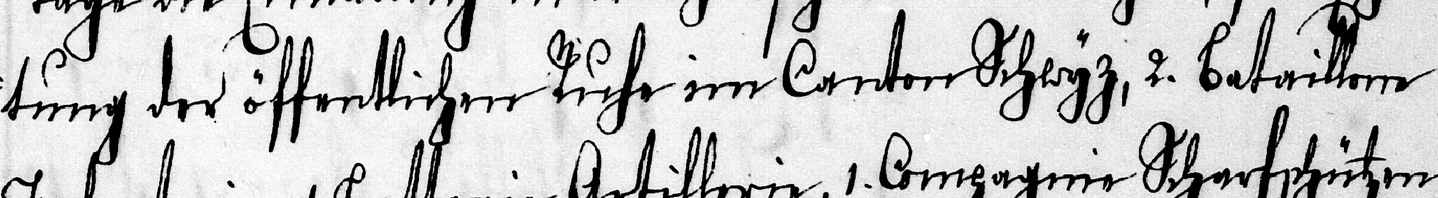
ung der öffentlichen Ruhe im Canton Schwyz, 2. Bataillone
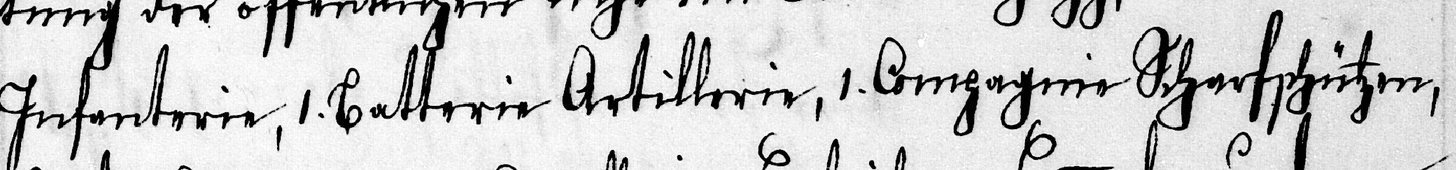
Infanterie, 1. Batterie Artillerie, 1. Compagnie Scharfschützen,
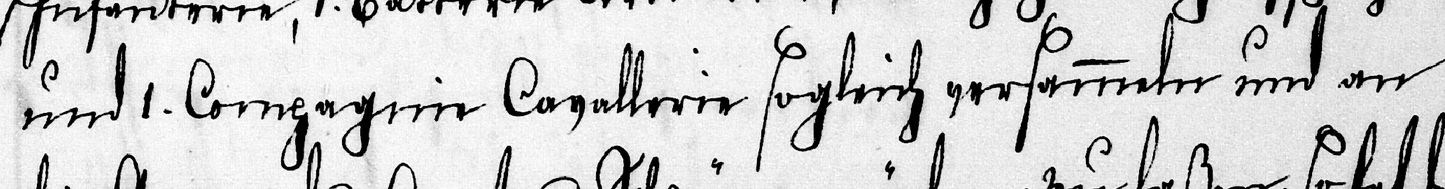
und 1. Compagnie Cavallerie sogleich versammeln und an
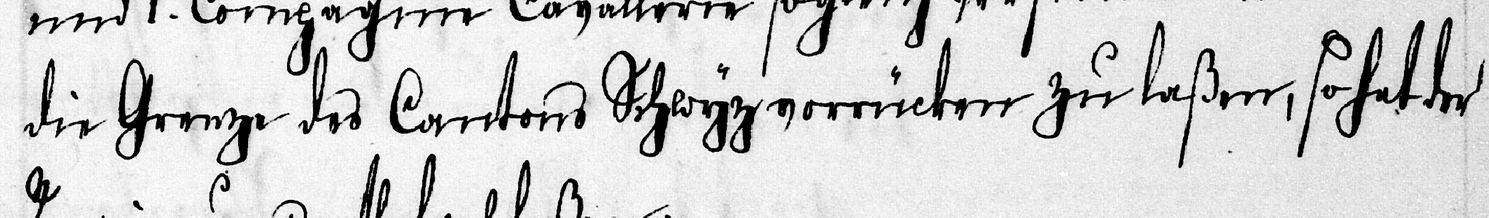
die Grenze des Cantons Schwyz vorrücken zu laßen, so hat der
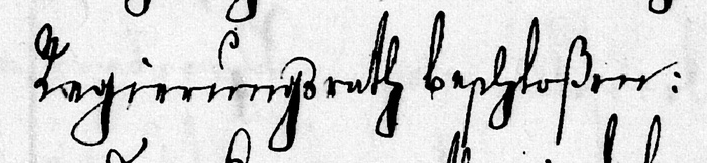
Regierungsrath beschloßen:
